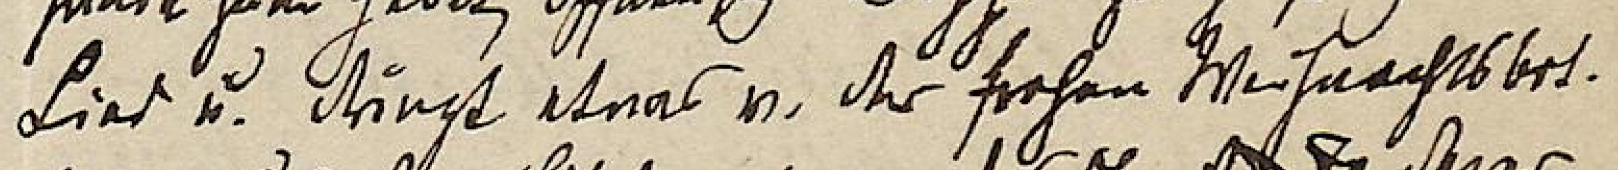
Lied u. drängt etwas v. der frohen Weihnachtsbot¬
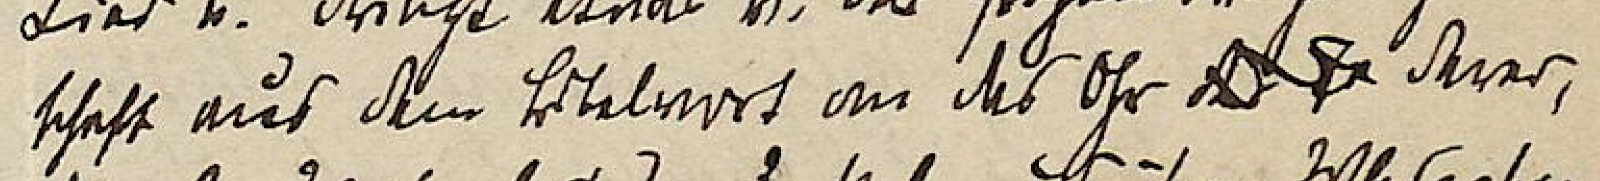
schaft aus dem Bibelwort an das Ohr der Fa derer,
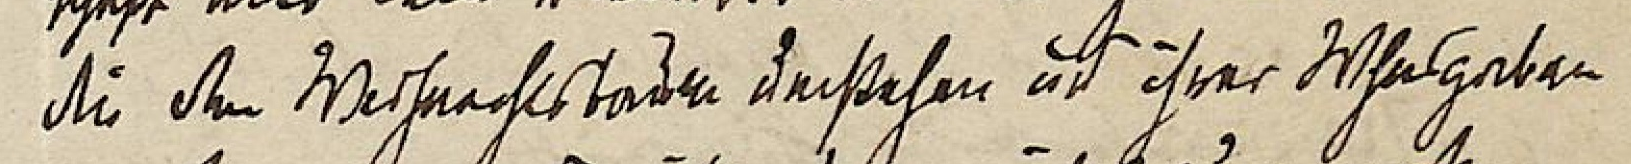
die den Weihnachtsbaum umstehen und ihrer Whnsgaben
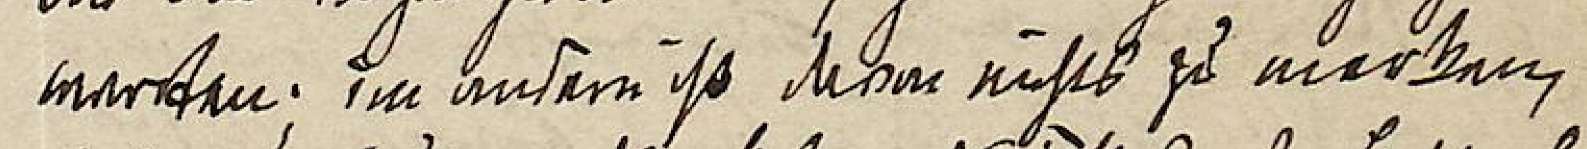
warten; im andern ist davon nichts zu merken,
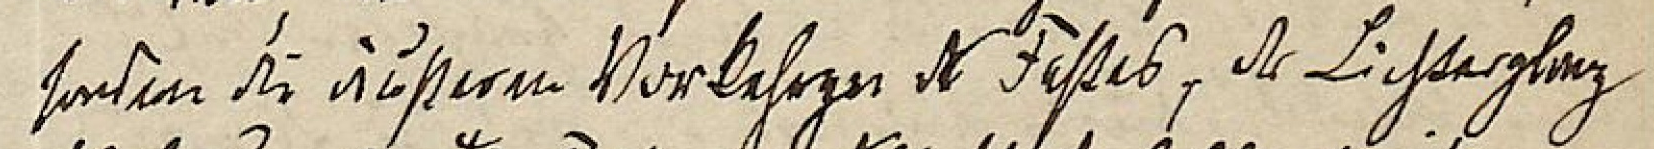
sondern die äußeren Vorkehrgn ds Festes, der Lichterglanz
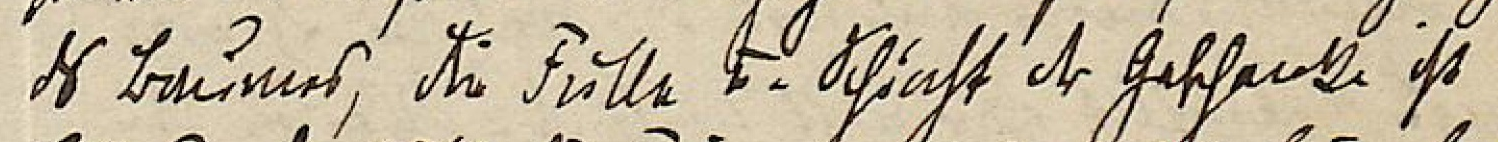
ds Baumes, die Fülle u. Schönht. der Geschenke ist
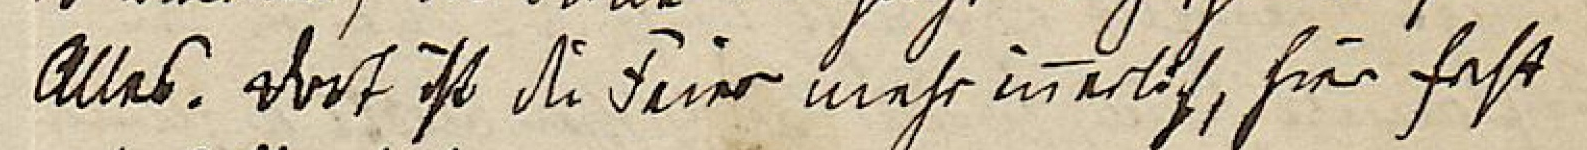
Alles. Dort ist die Feier mehr inerlich, hier fast
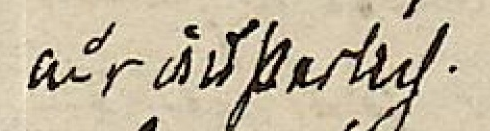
nur äußerlich.
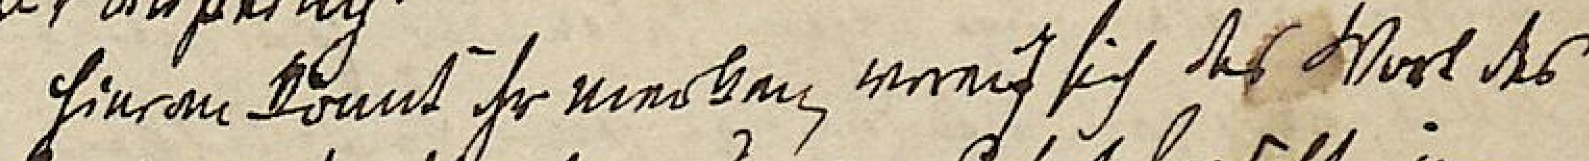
Hieran könnt ihr merken, worauf sich das Wort des
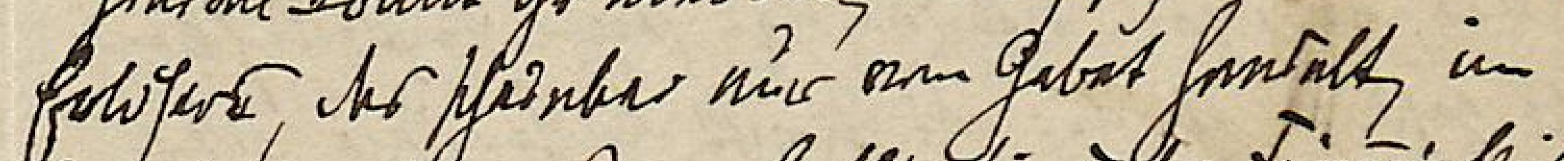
Erlösers, das scheinbar nur vom Gebet handelt, im
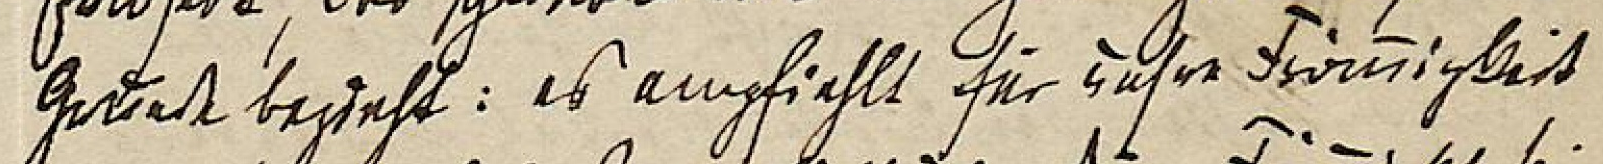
Grunde bezieht: es empiehtl für unsre Frömigkeit
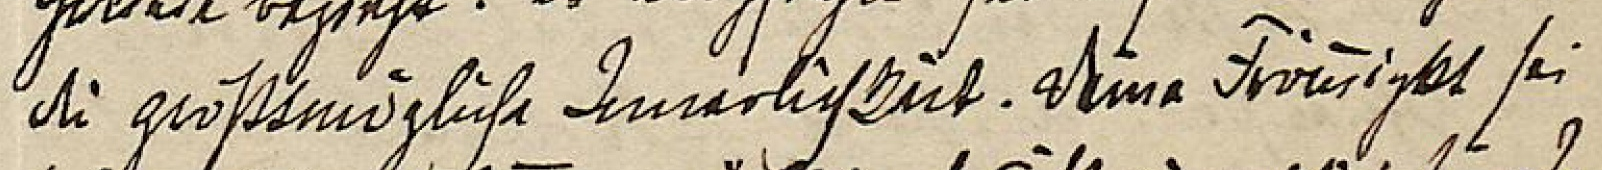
die größtmögliche Innerlichkeit. Deine Frömigkeit sei
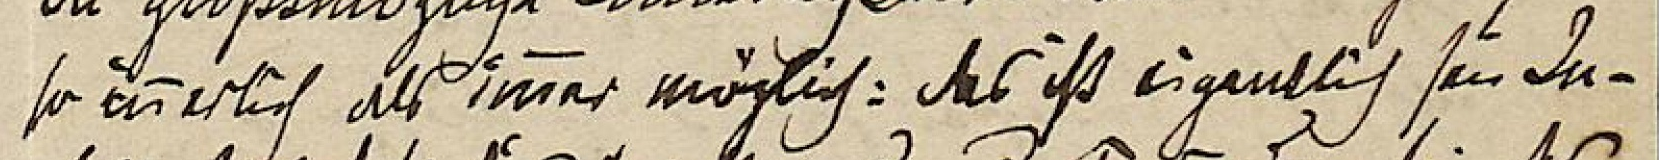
so inerlich als imer möglich: das ist eigentlich sein In¬
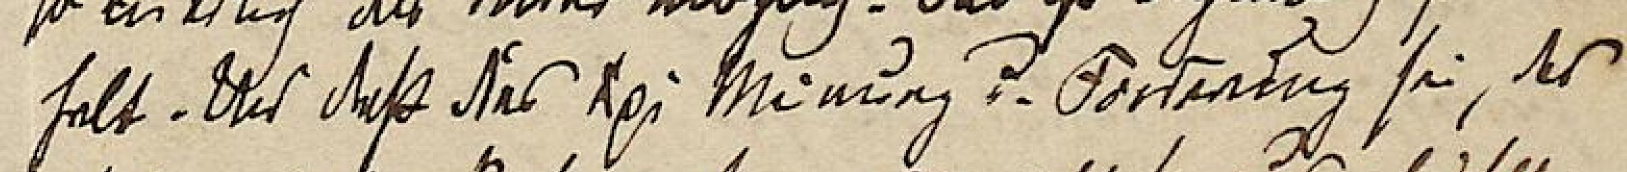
halt. Und daß dies Χρι Meinung u. Forderung sei, das
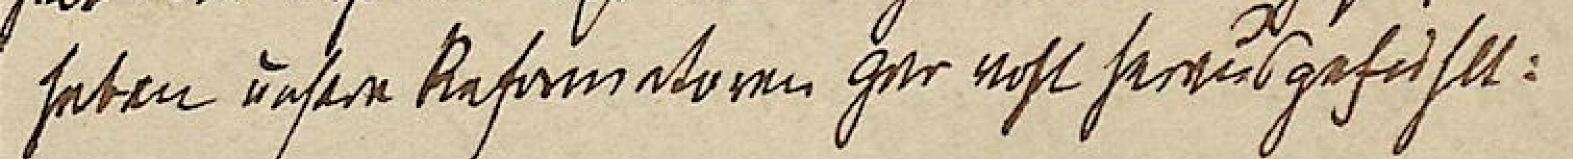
haben unsere Reformatoren gar wohl herausgefühlt:
